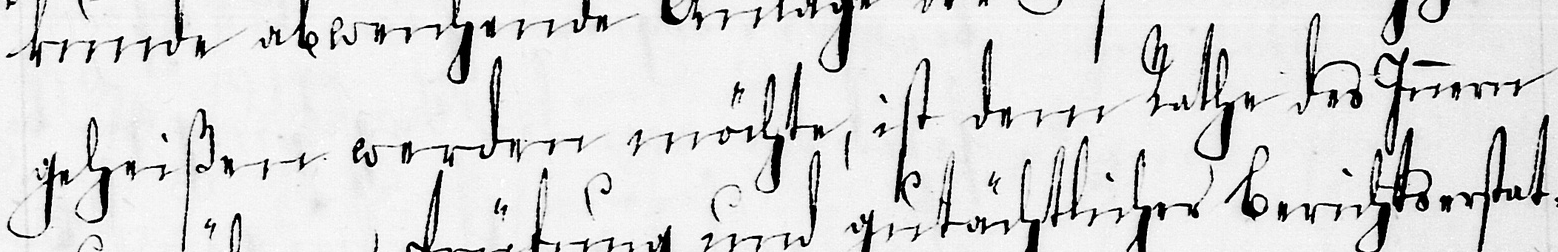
geheißen werden möchte, ist dem Rathe des Innern
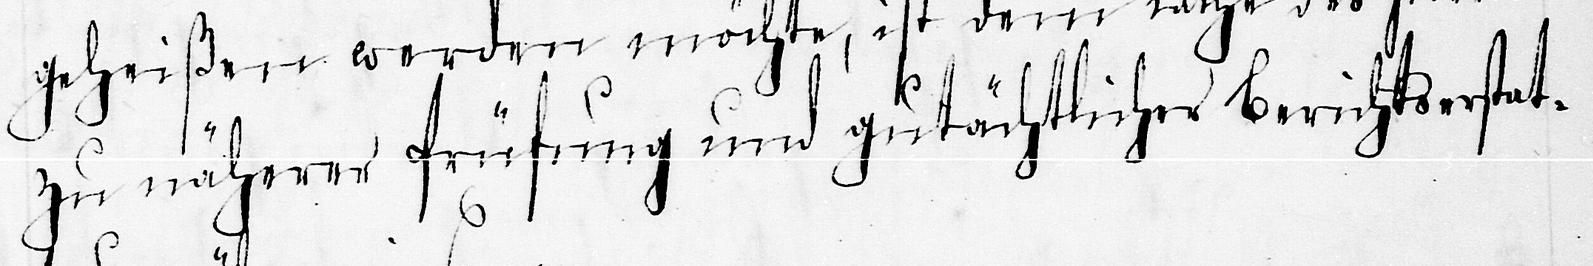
zu näherer Prüfung und gutächtlicher Berichtserstat¬
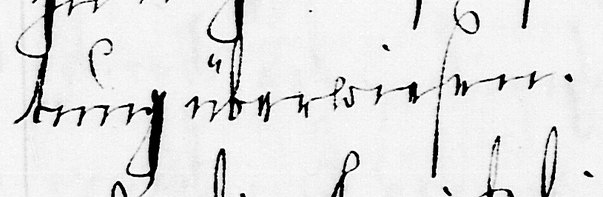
tung überwiesen.
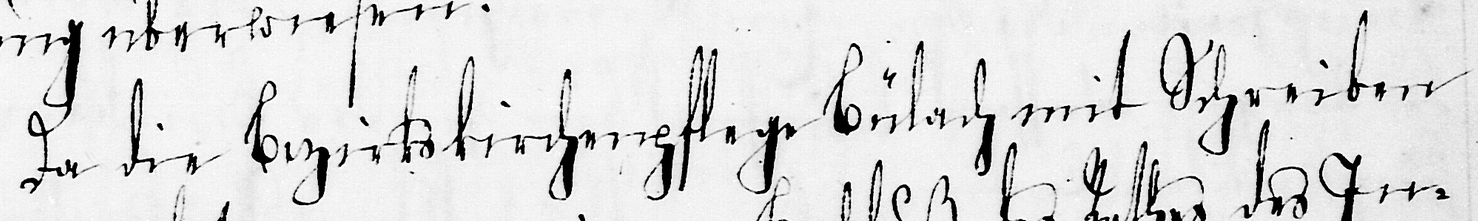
Da die Bezirkskirchenpflege Bülach mit Schreiben
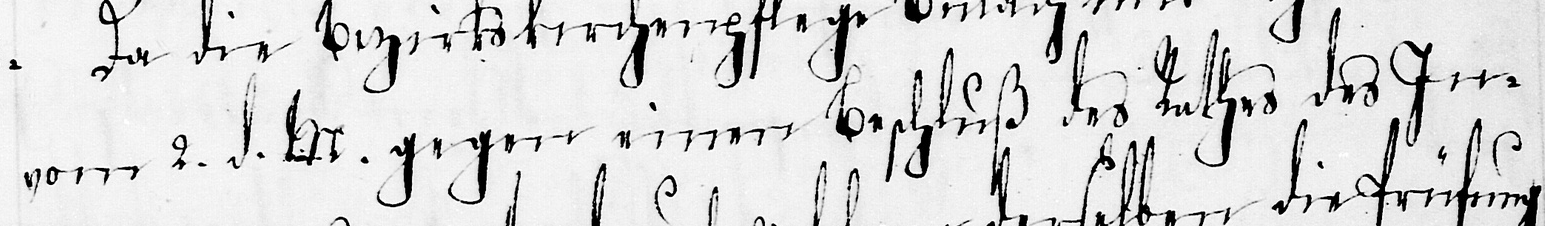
vom 2. d. M. gegen einen Beschluß des Rathes des In¬
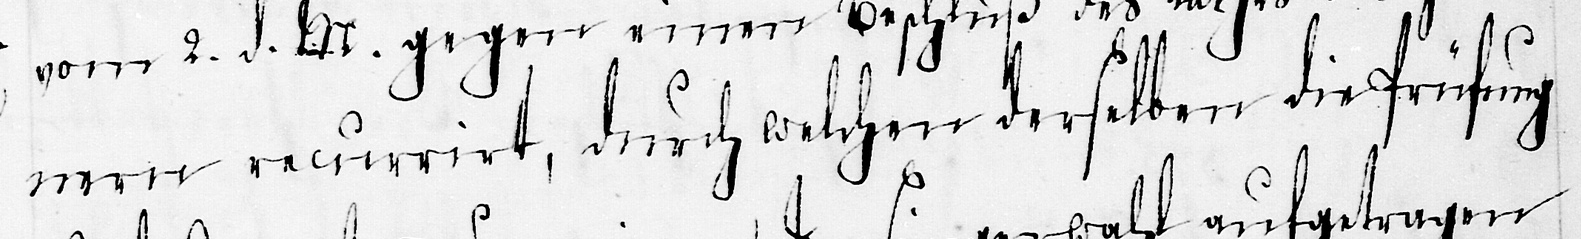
nern recurrirt, durch welchen derselben die Prüfung
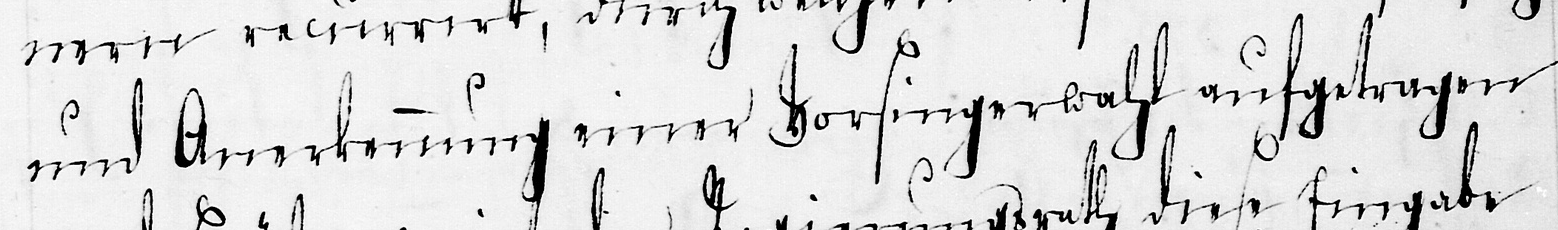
und Anerkennung einer Vorsingerwahl aufgetragen
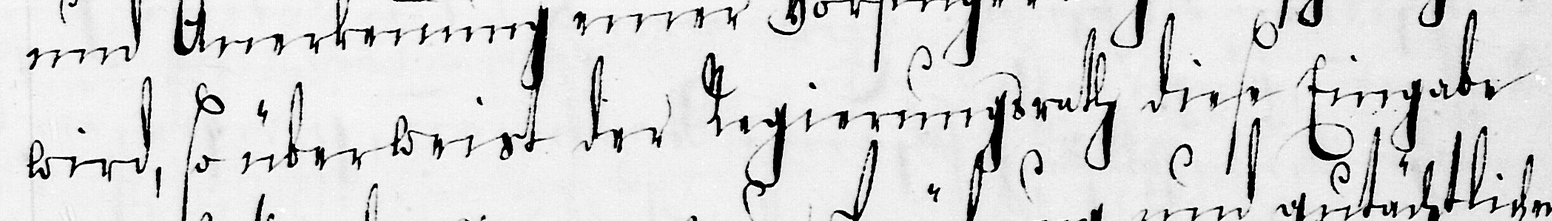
wird, so überweist der Regierungsrath diese Eingabe
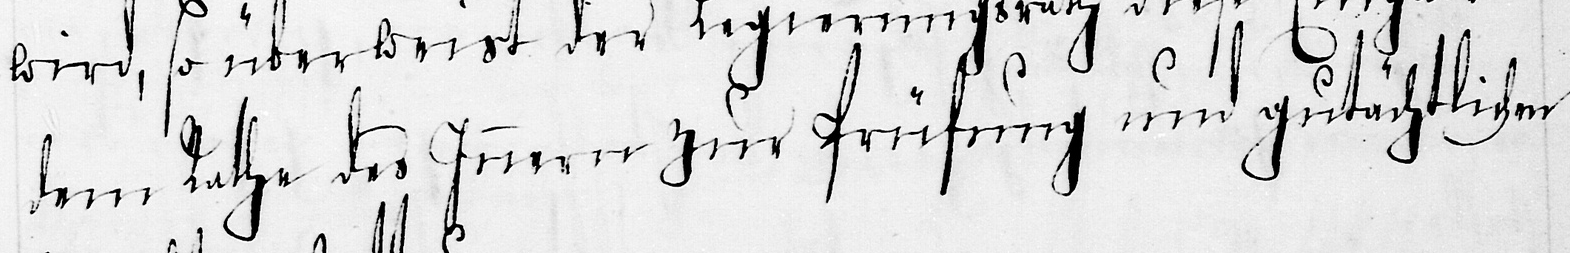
dem Rathe des Innern zur Prüfung und gutächtlich¬
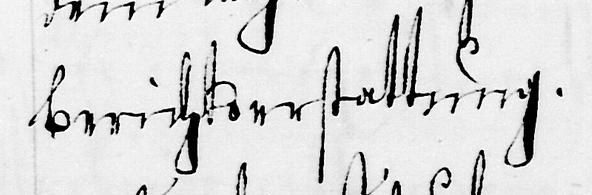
Berichtserstattung.
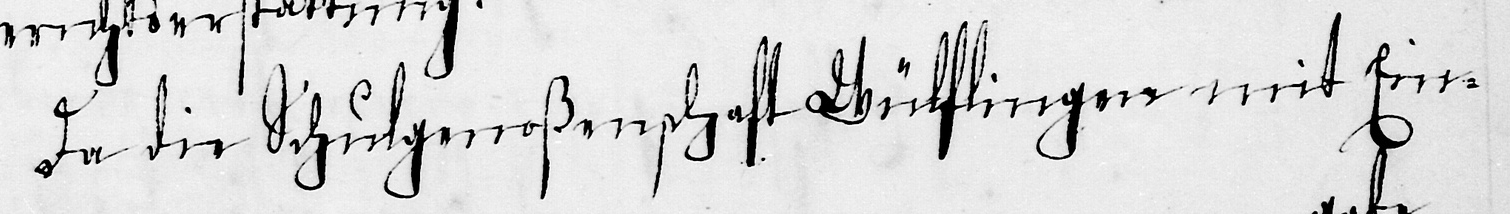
Da die Schulgenoßenschaft Wülflingen mit Ein-
